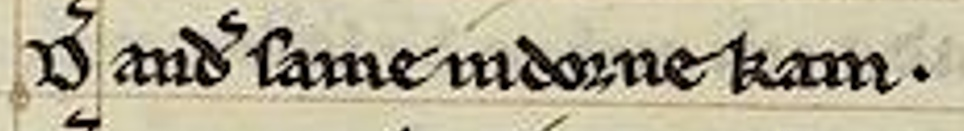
D(er) and(er) ſame in dorne kam.
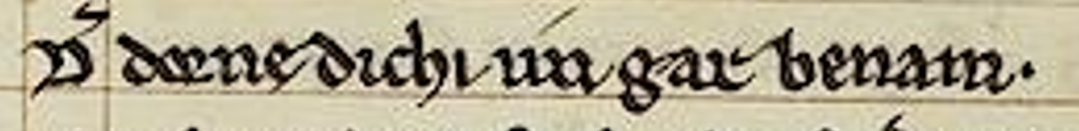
D(er) dorne dichi im gar benam.
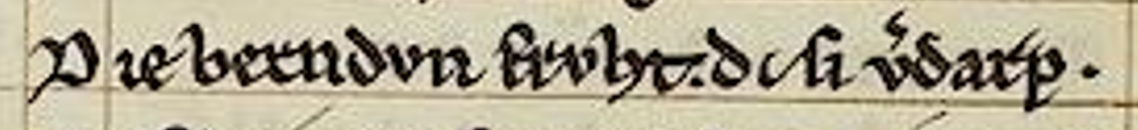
Die berndvn frvht. d(az) ſi v(er)darp.
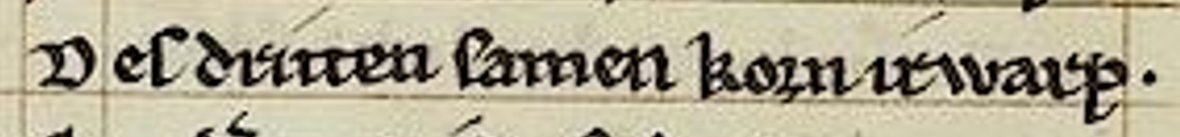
Deſ dritten ſamen korn irwarp.
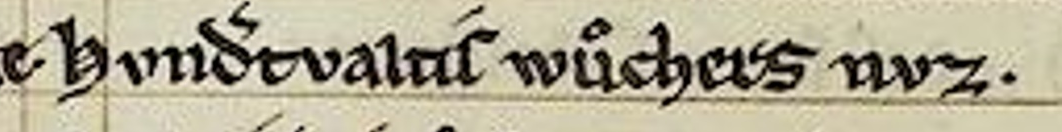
Hvnd(er)tvatliſ wu°ochers nvz.
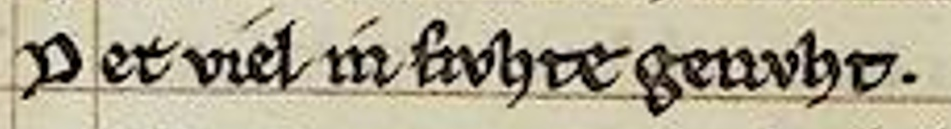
Der viel in fivhte genvht.
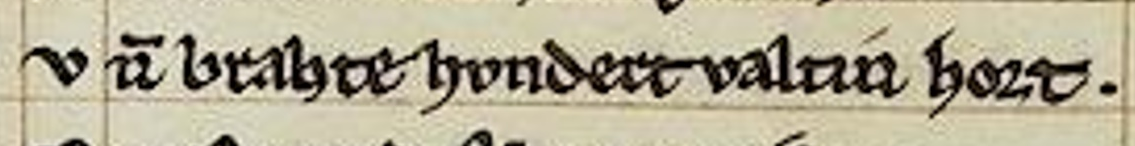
Vn(d) brahte hvndert valtin hort.
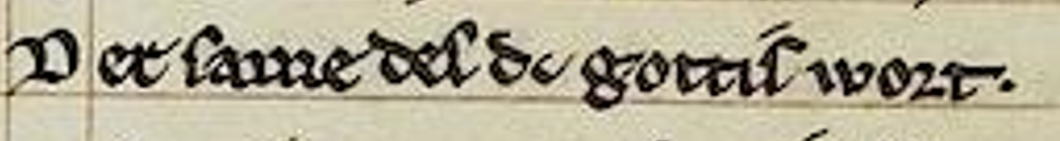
Der ſame deſ d(az) gottiſ wort.
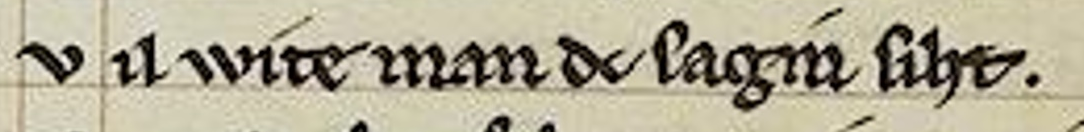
Vil wite man d(az) ſagin ſiht.
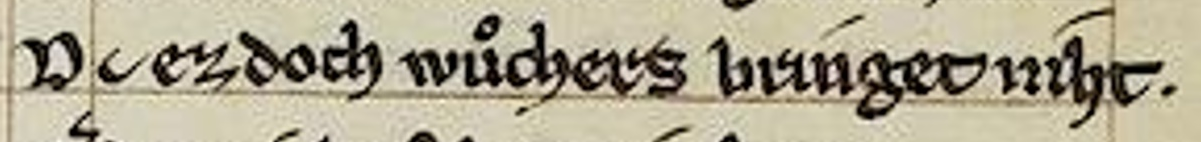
D(az) ez doch wu°ochers bringet niht.
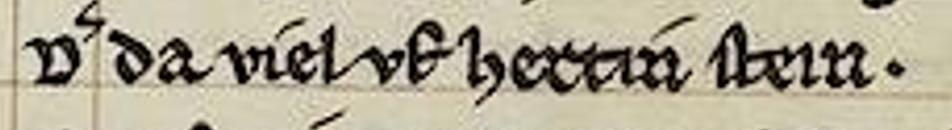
D(er) da viel vf hertin ſtein.
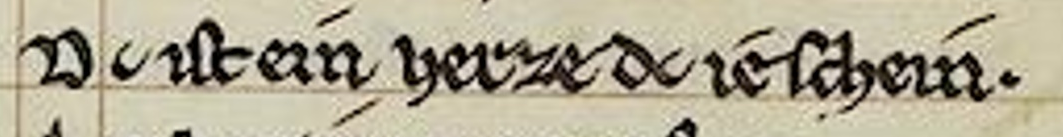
D(az) iſt ein herze d(az) ie ſchein.
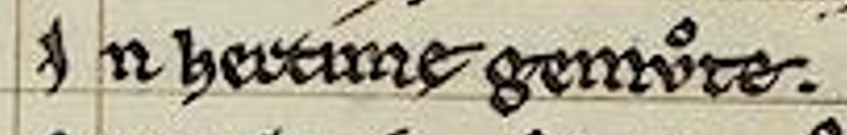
In hertime gemv°ote.
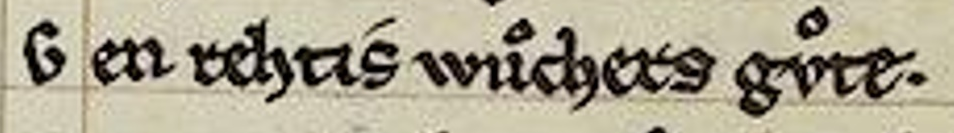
Gen rehtis wu°ochers gv°ote.
